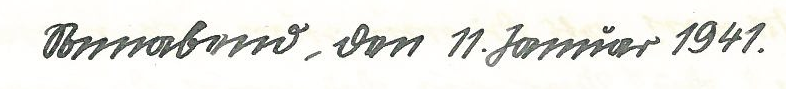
Sonnabend, den 11. Januar 1941.
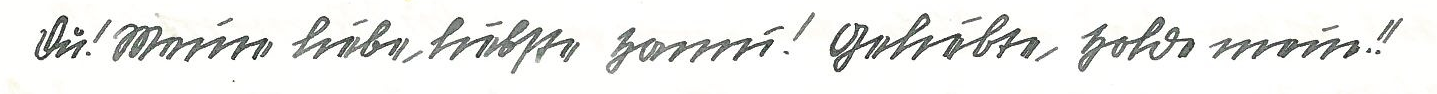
Du! Meine liebe, liebste! Geliebte, Holde mein!!
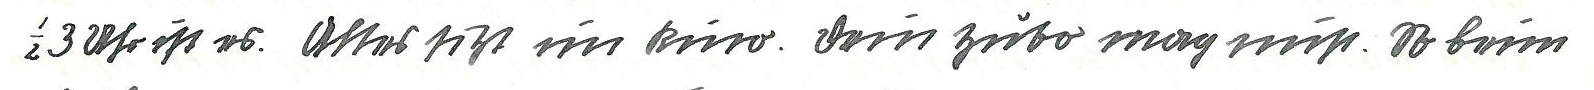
½ 3 Uhr ist es. Alles sitzt im Kino. Dein Hubo mag nicht. So beim
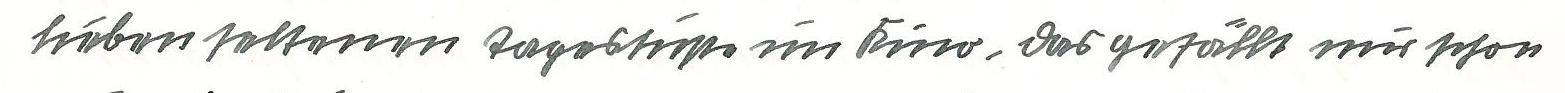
lieben seltenen Tageslichte im Kino, das gefällt mir schon
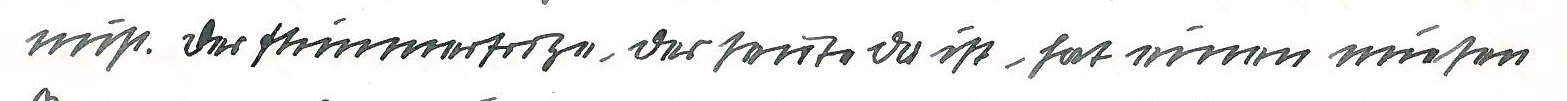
nicht. Der Flimmerfritze, der heute da ist, hat einen miesen
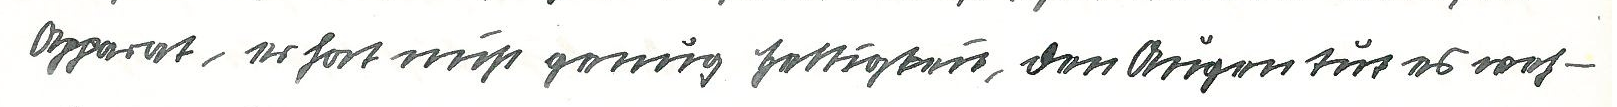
Apparat, er hat nicht genug Helligkeit, den Augen tut es weh –
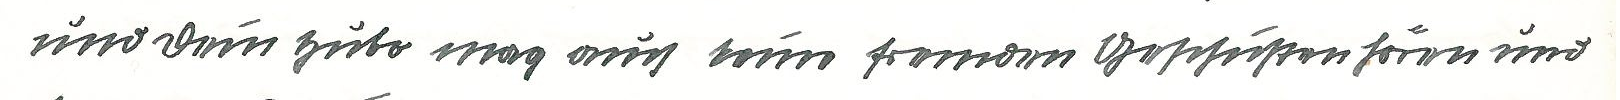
und Dein Hubo mag auch keine fremden Geschichten hören und
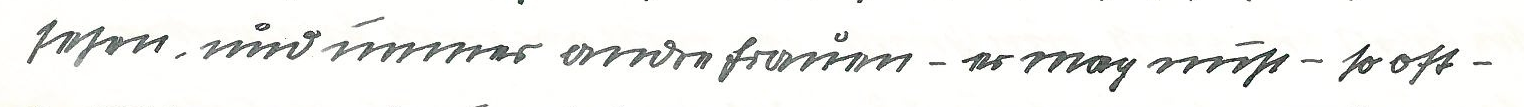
sehen, und immer and[e]re Frauen – er mag nicht – so oft –
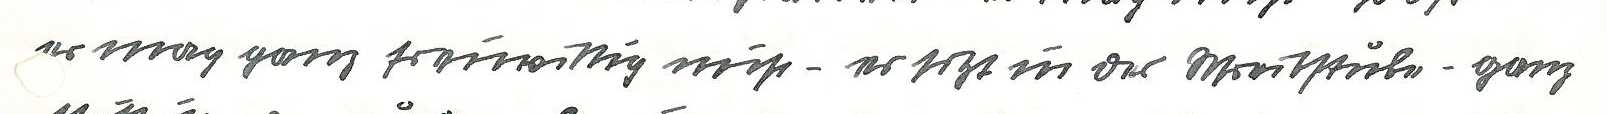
er mag ganz freiwillig nicht – er sitzt in der Schreibstube – ganz
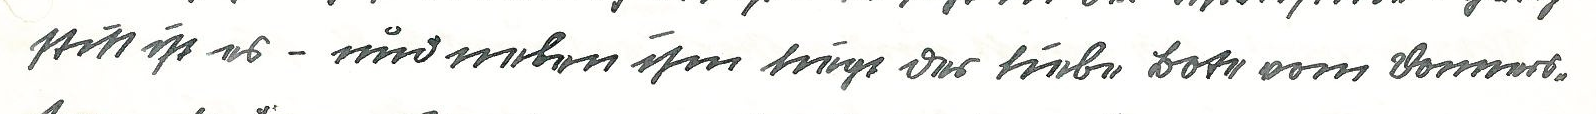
still ist es – und neben ihm liegt der liebe Bote vom Donners¬
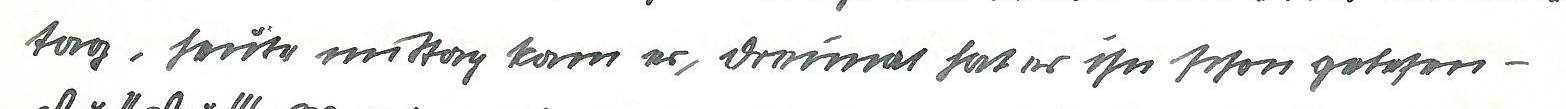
tag, heute mittag kam er, dreimal hat er ihn schon gelesen –
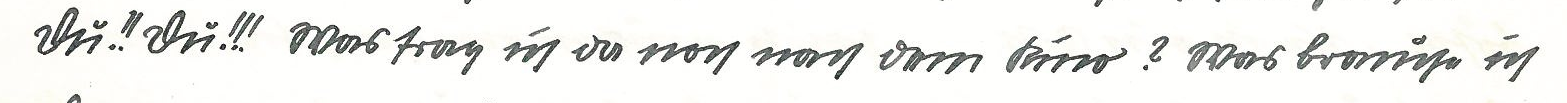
Du!! Du!!! Was frag ich da noch nach dem Kino? Was brauche ich
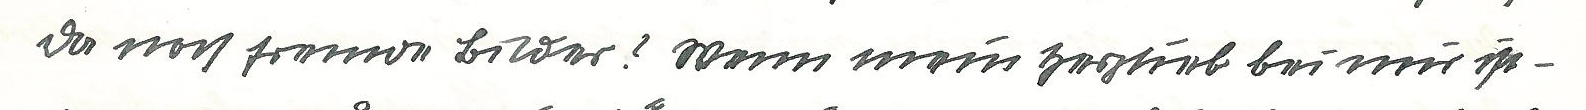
da noch fremde Bilder? Wenn mein Herzlieb bei mir ist –
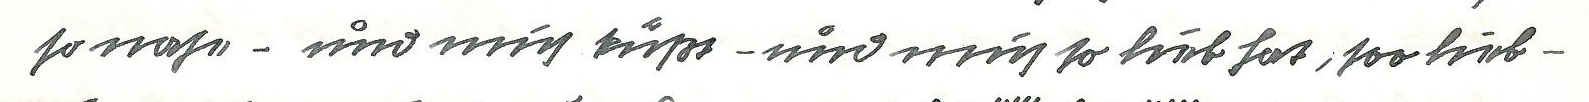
so nahe – und mich küßt – und mich so lieb hat, soo lieb –
